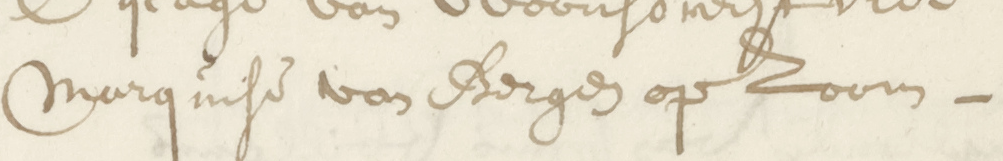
marquise van Bergen op Zoom -
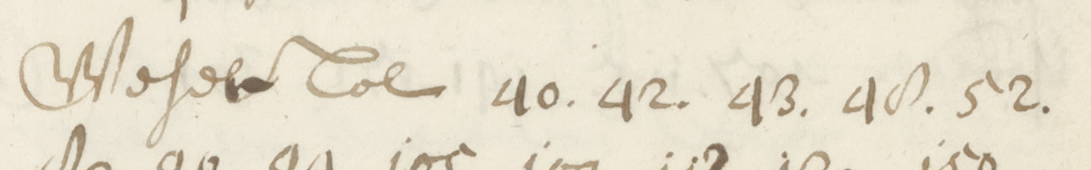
Wesel Tol, 40, 42, 43, 48, 52,
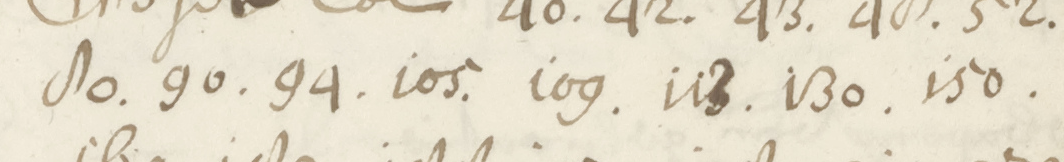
80, 90, 94 105, 109, 113, 130, 150,
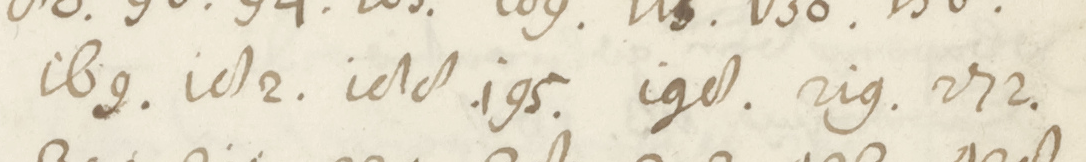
169, 182, 188, 195, 198, 219, 272,
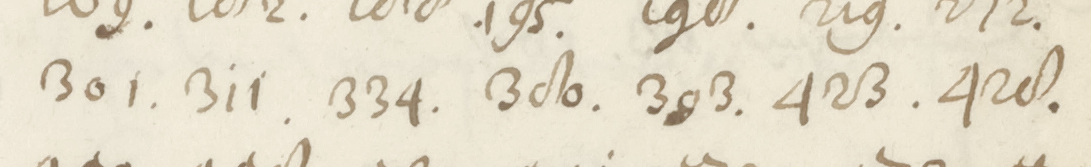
301, 311, 334, 380, 393, 423, 428,
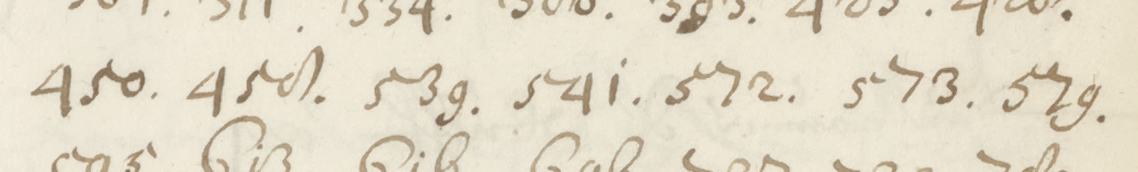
450, 458, 539, 541, 572, 573, 579,
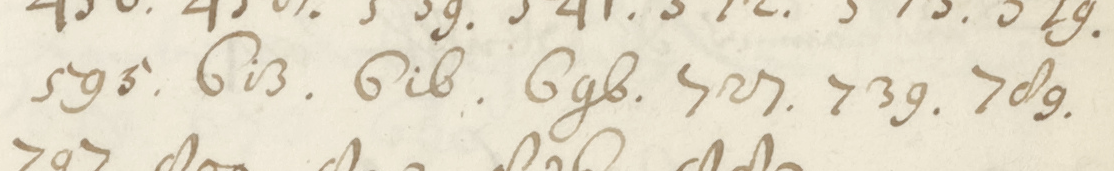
595, 613, 616, 696, 727, 739, 789,
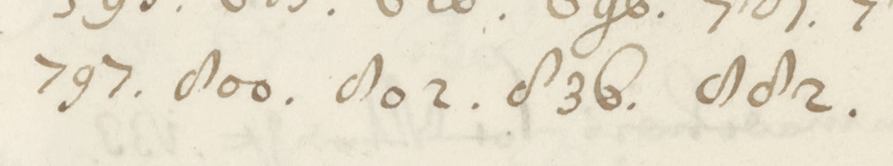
797, 800, 802, 836, 882.
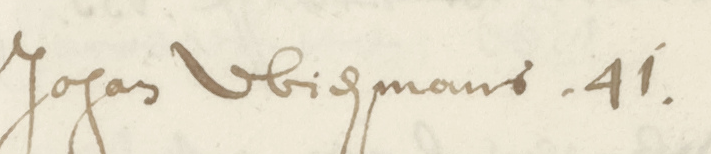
Johan Wichmans, 41.
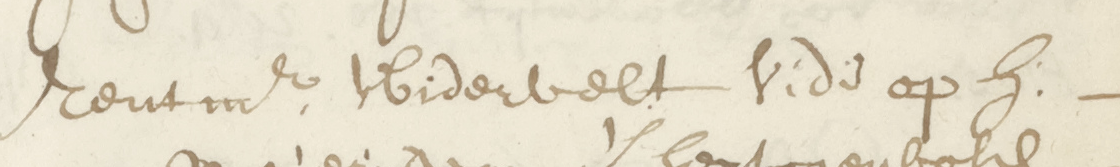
rentmr. Widervelt vide op h:
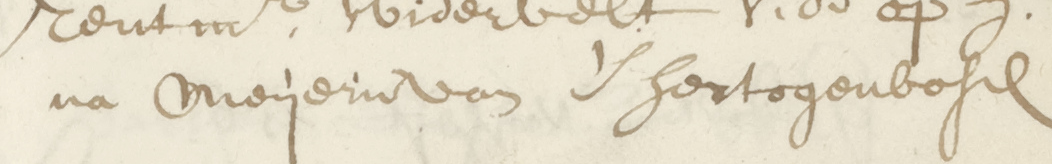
na Meijerie van 'shertogenbosch
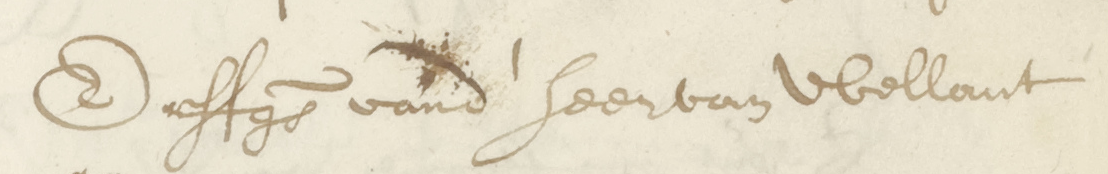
Erffgs vand' heer van Wellant
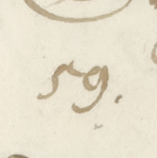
59.
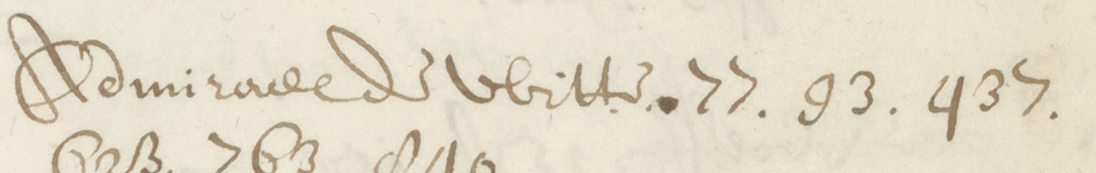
Admirael de Witte, 77, 93, 437,
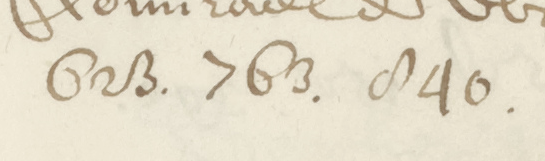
623, 763, 840.
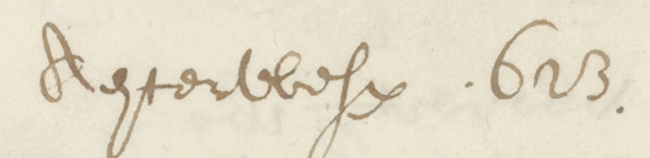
Achterwesen, 623.
